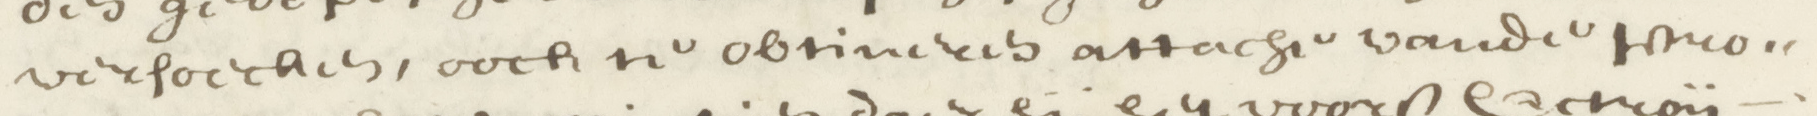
versoecken, oock te obtineren attache vande pro„
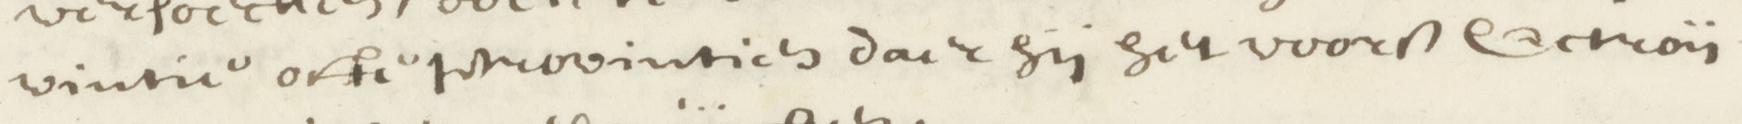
vintie ofte provintien daer hij het voors Octroij
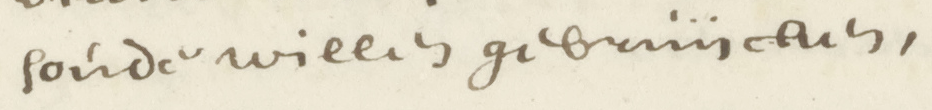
soude willen gebruijcken.
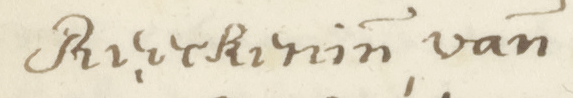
Reekenin van
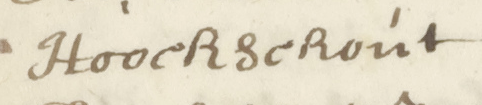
Hoochschout
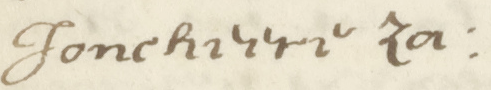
Joncheere za:
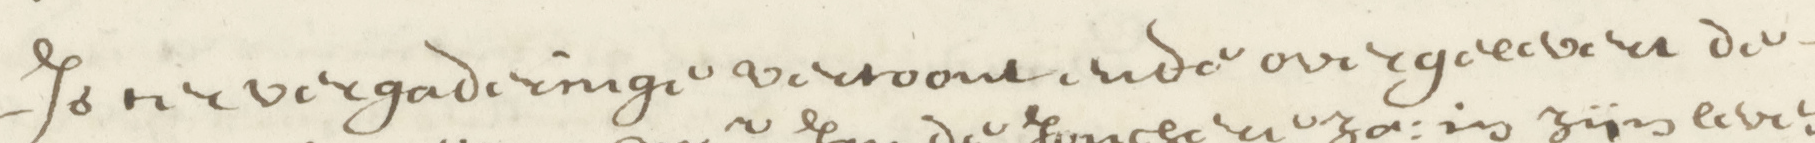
Is ter vergaderinge vertoont ende overgelevert de
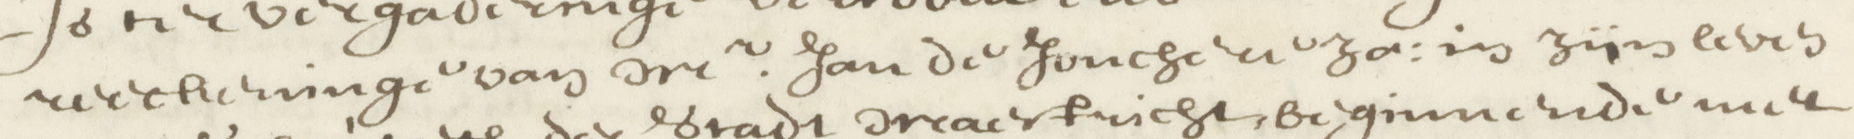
reeckeningen van mr Jan de Jonchere za: in zijn leven
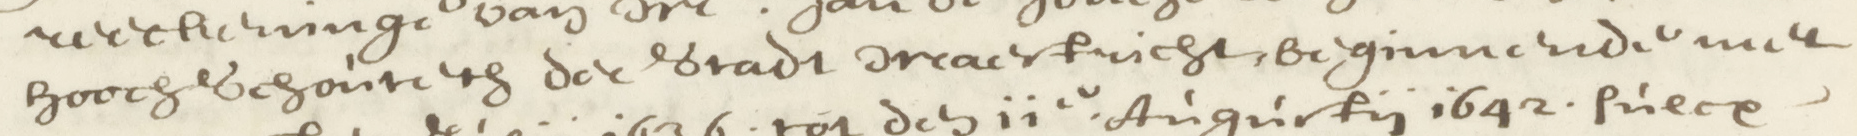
hoochschouteth der Stadt Maestricht, beginnende met
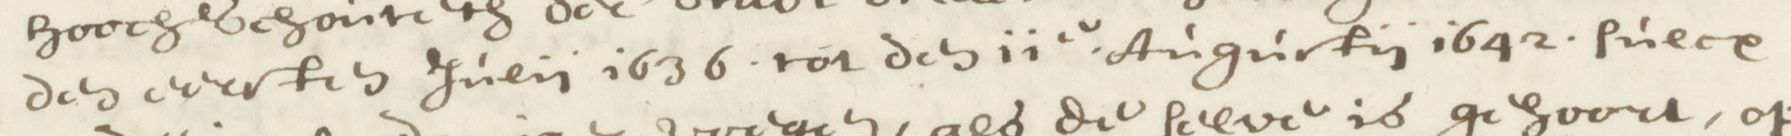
den eersten Julij 1636 tot des iie Augustij 1642 sulcx
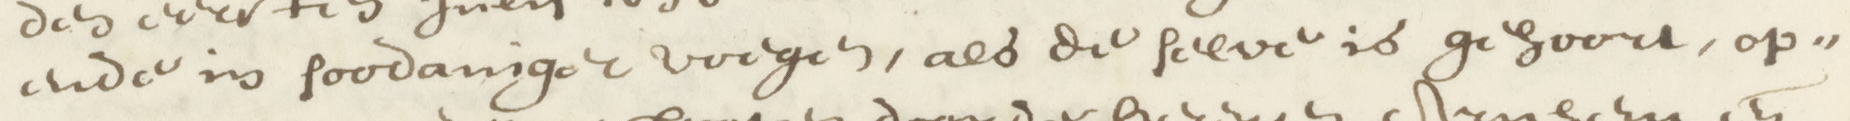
ende in soodaniger voegen, als de selve is gehoort, op„
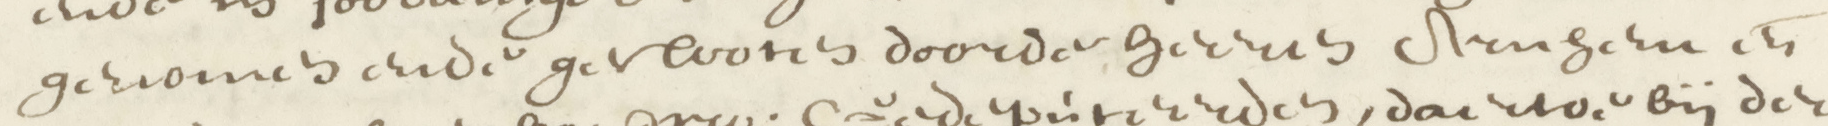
genomen ende geslooten doorde heeren Arnhem en
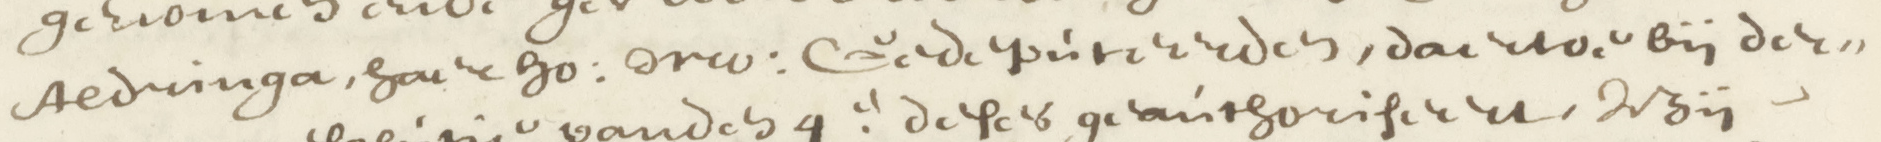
Aldringa, haere Ho:Mo: Gedeputeerden, daertoe bij der„
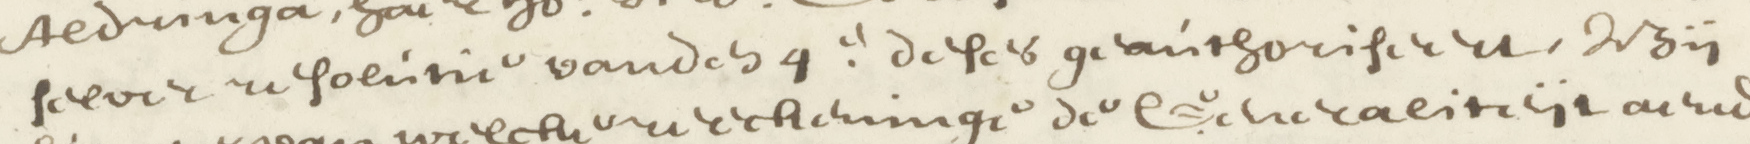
selver resolutie vanden 9e deses geauthoriseert. Bij
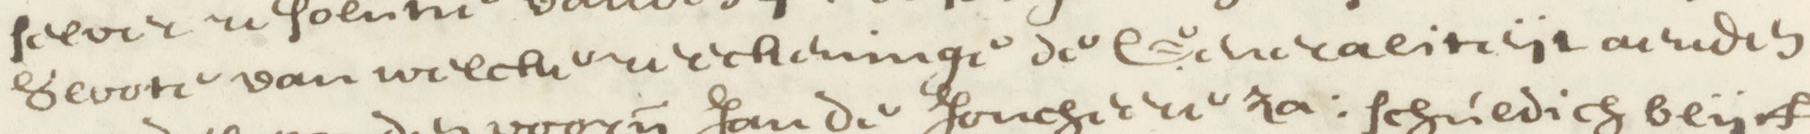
Sloote van welcke reeckeninge de Generaliteijt aenden
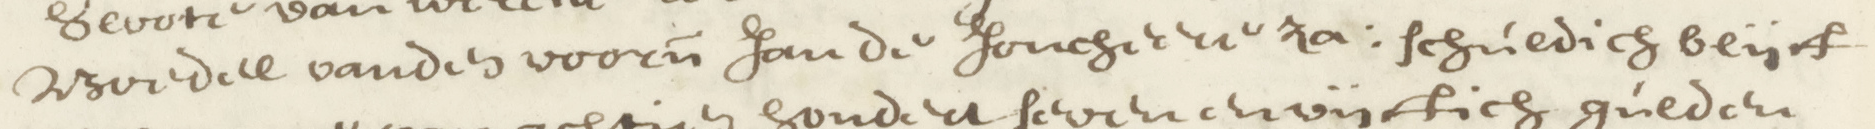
Boedel vanden voorn Jan de Joncheere za: schuldich blijft
